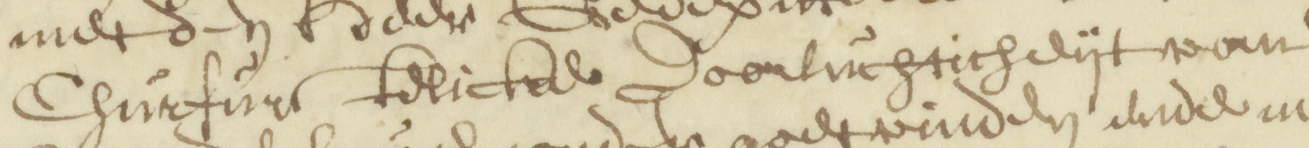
Churfurstelicke Doorluchticheijt van
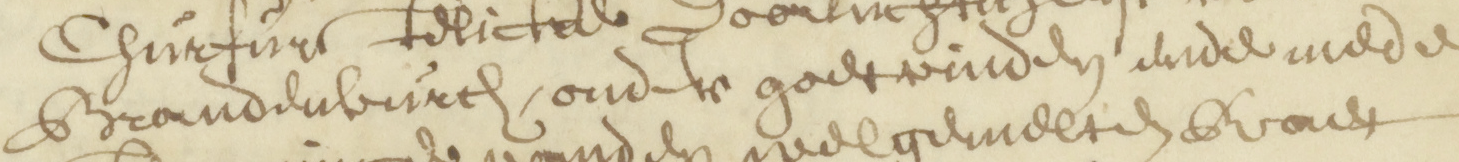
Brandenburch, onder goetvinden ende mede
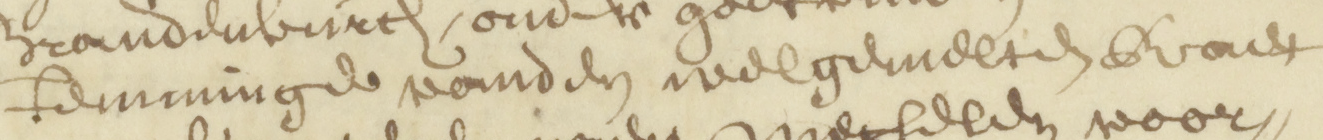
stemminge vanden welgemelten Raet
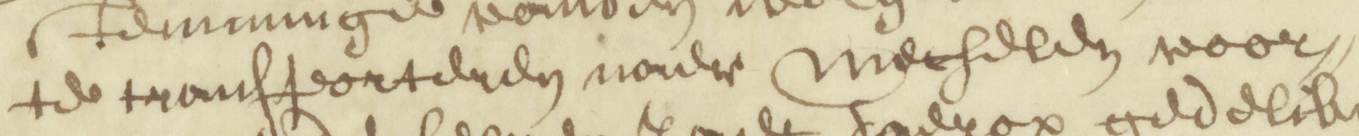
te transporteren naer Mechelen voor„
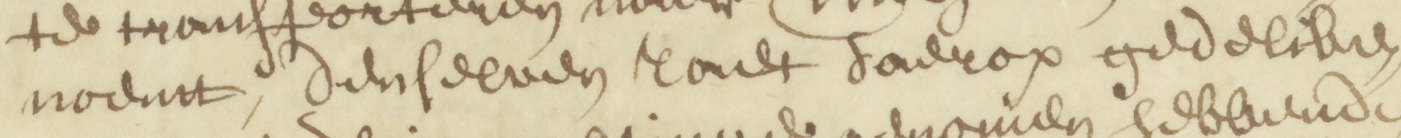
noemt, denselven raet daerop gedelibe„
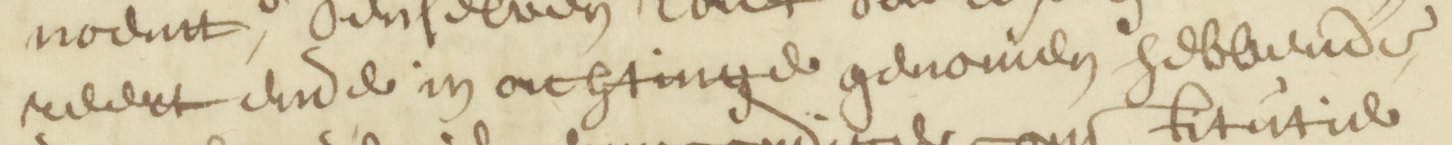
reert ende in achtinge genomen hebbende
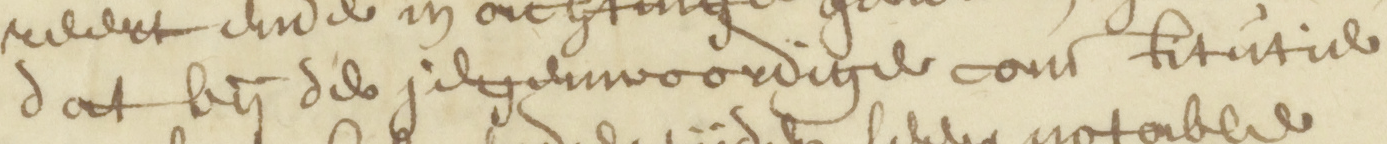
dat bij de jegenwoordige constitutie
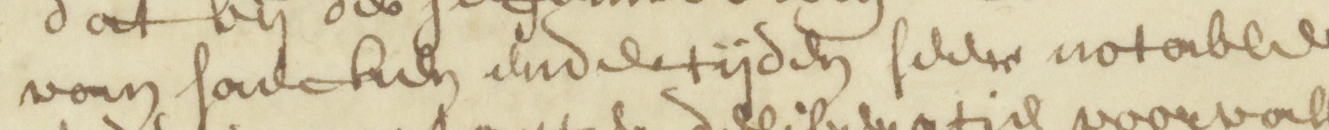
van saecken ende tijden seer notable
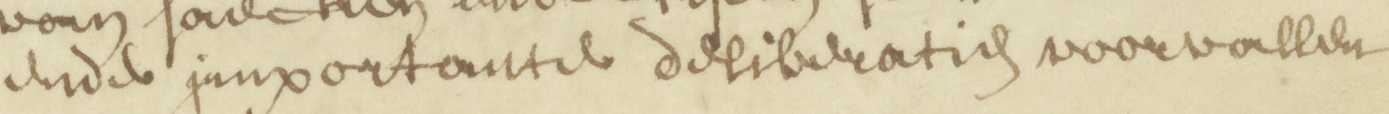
ende importante deliberatien voorvallen
